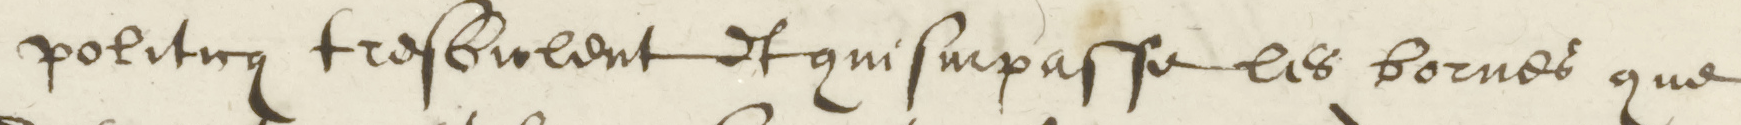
politicq tres violent et qui surpasse les bornes que
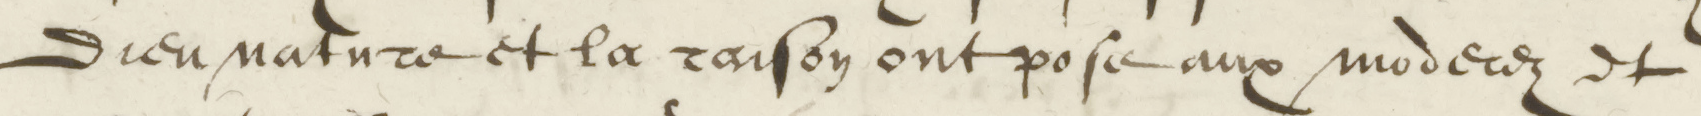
Dieu nature et la raison ont pose aux moderez et
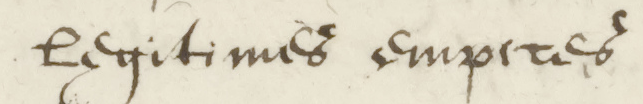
legitimes empires
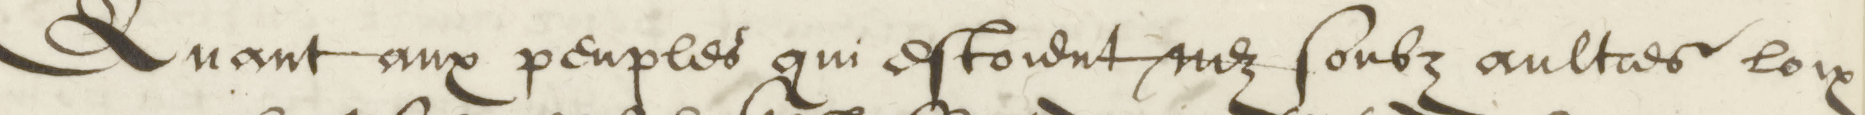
Quant aux peuples qui estoient nez soubz aultres loix
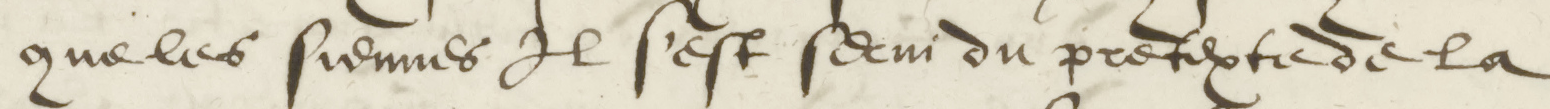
que les siennes il s'est serui du pretexte de la
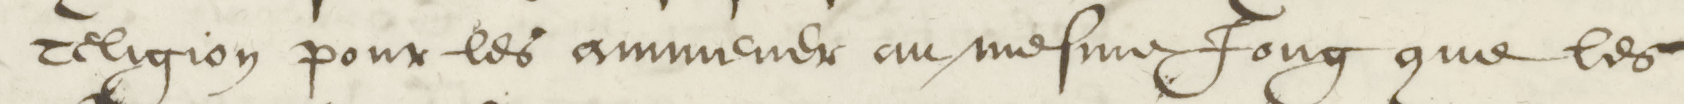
religion pour les ammener au mesme Jong que les
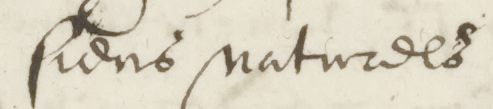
siens naturels
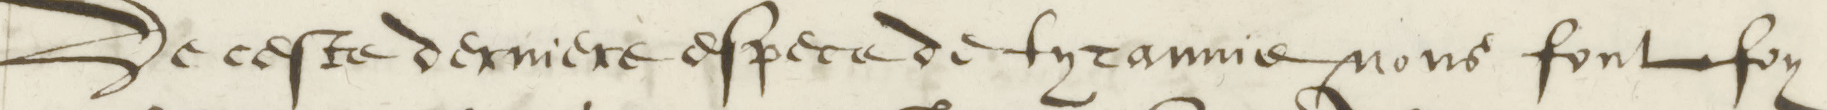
De ceste derniere espece de tyrannie nous font foy
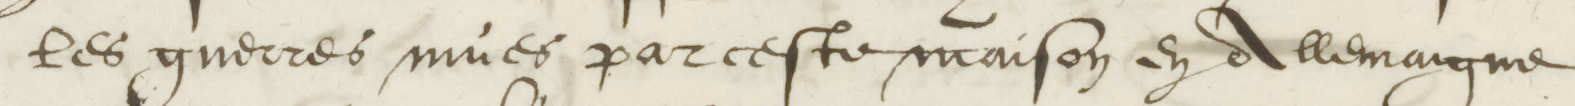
les guerres mues par ceste maison en Allemaigne
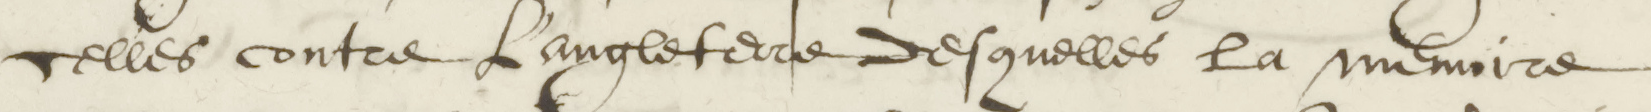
celles contre L‛angletere desquelles la memoire
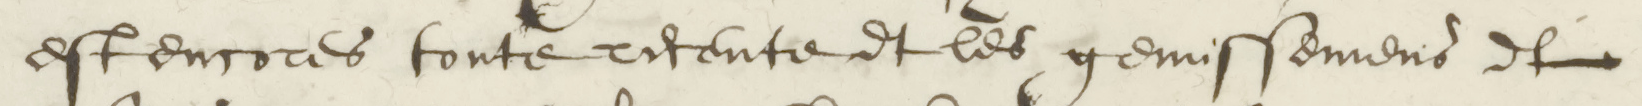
est encores toute recente et les gemissemens et
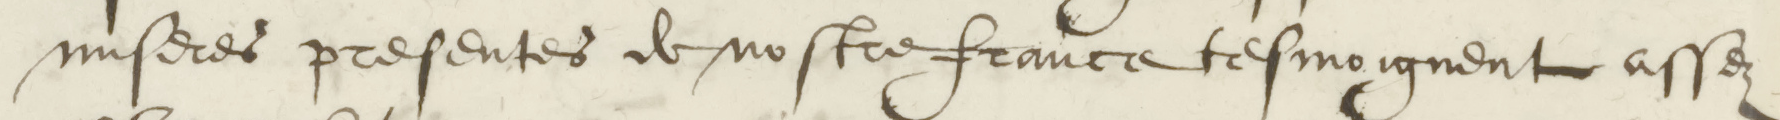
miseres presentes de nostre France tesmoignent assez
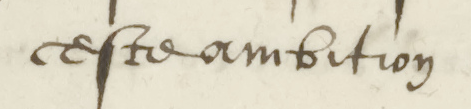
ceste ambition
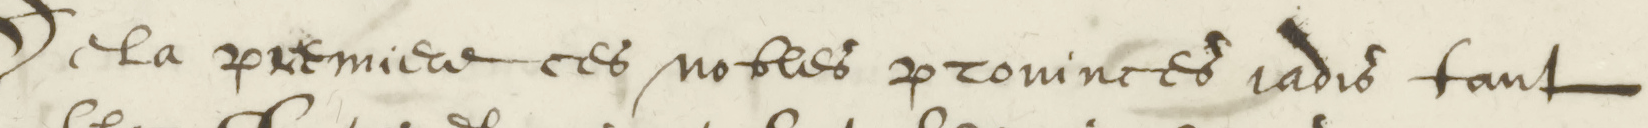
Dela premiere ces nobles prouinces iadis tant
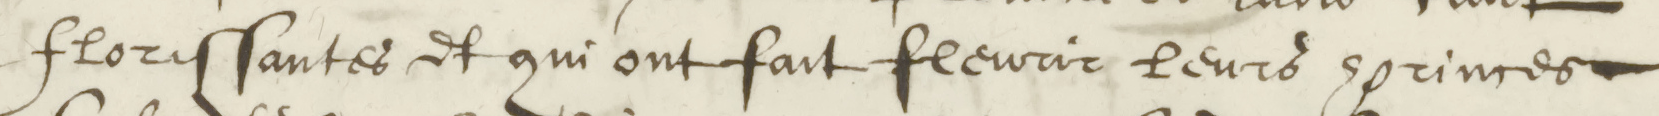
florissantes et qui ont fait fleurir leurs Princes
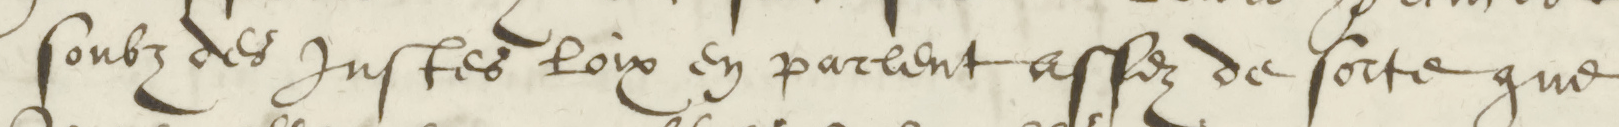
soubz des justes loix en parlent assez de sorte que
